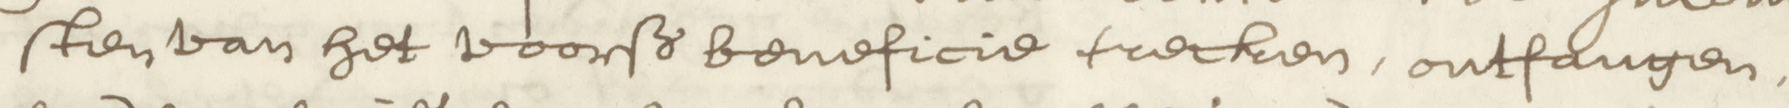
sten van het voors beneficie trecken, ontfangen
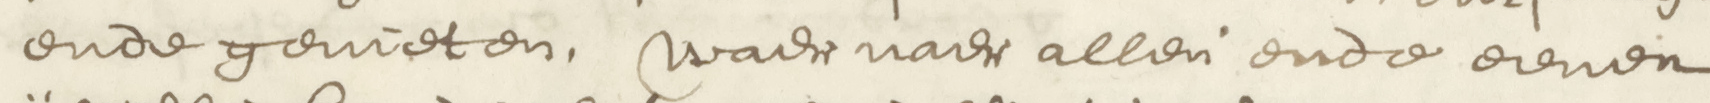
ende genieten, waer naer allen ende eenen
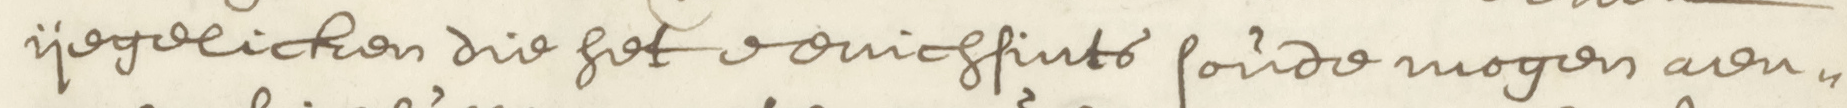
ijegelicken die het eenichsints soude mogen aen„
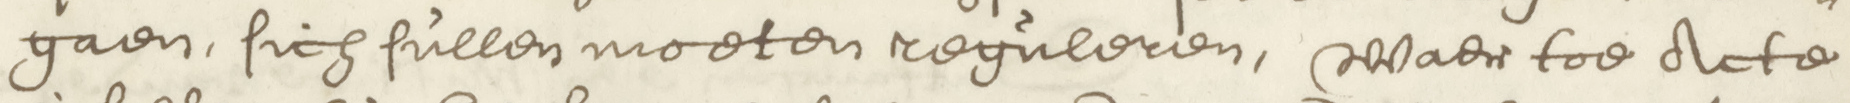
gaen, sich sullen moeten reguleren, Waer toe Acte
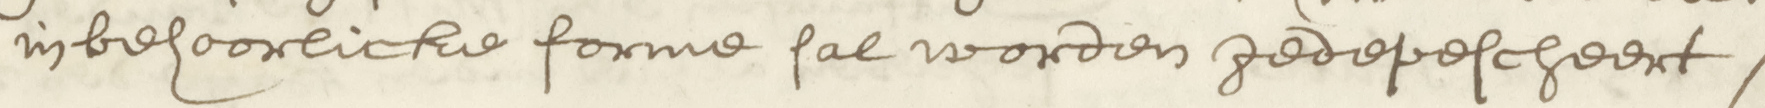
in behoorlicke forme sal worden gedepescheert,
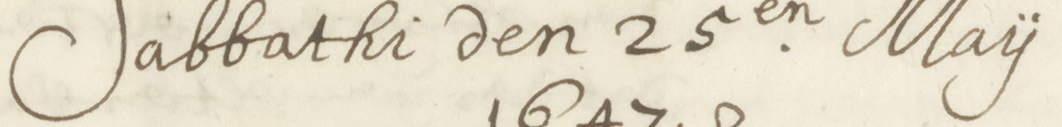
Sabbathi den 25en. Maij
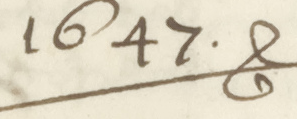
1647
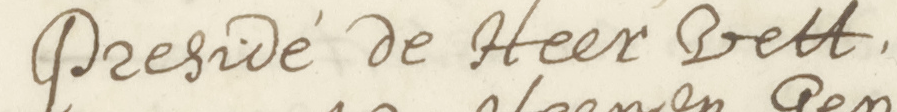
Preside de Heer Vett,
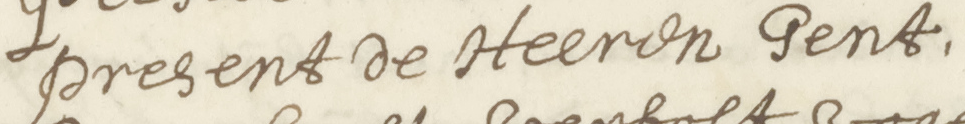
Present de Heeren Gent,
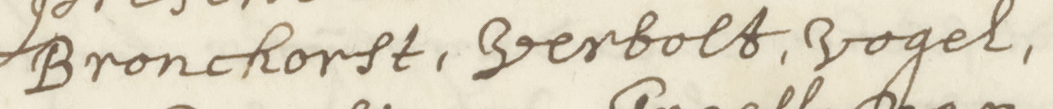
Bronchorst, Verbolt, Vogel,
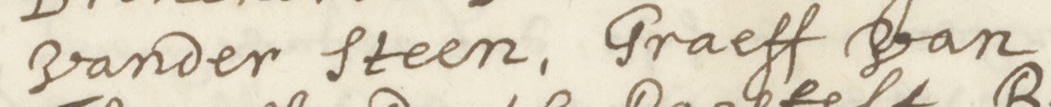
vander Steen, Graeff van
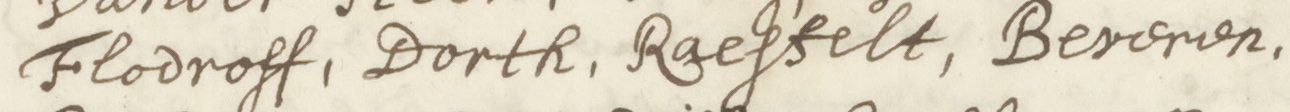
Flodroff, Dorth, Raesselt, Beveren.
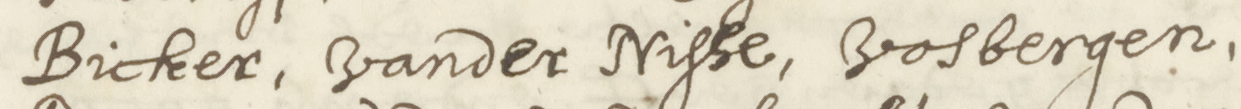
Bicker, vander Nisse, Vosbergen,
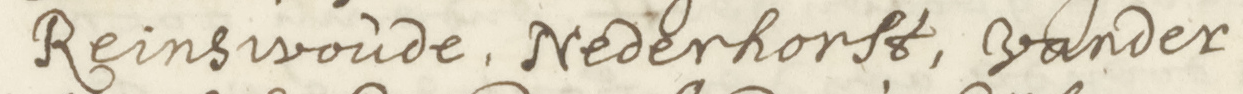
Reinswoude, Nederhorst, vander
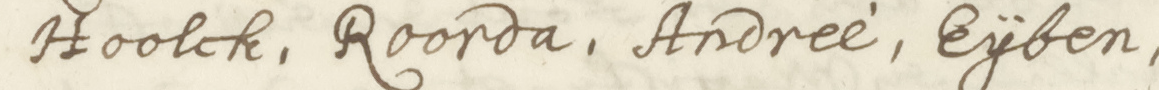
Hoolck, Roorda, Andreé, Eijben.
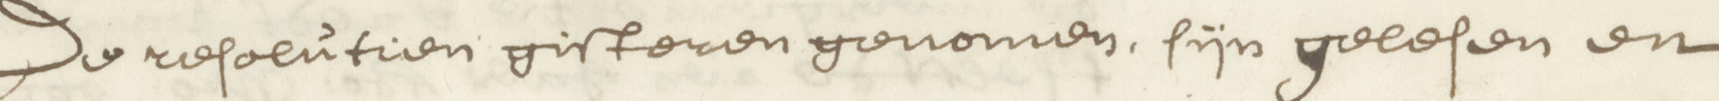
De resolutien gisteren genomen, sijn gelesen en
